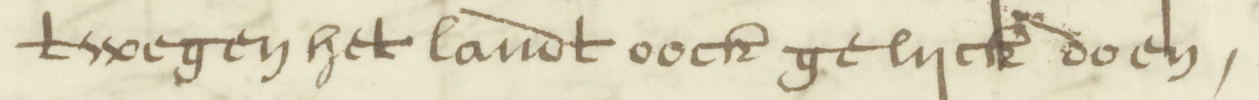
twegen het landt oock gelyck doen.
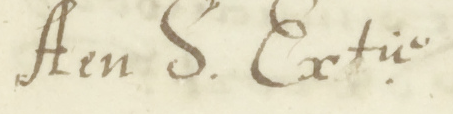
Aen S. Extie
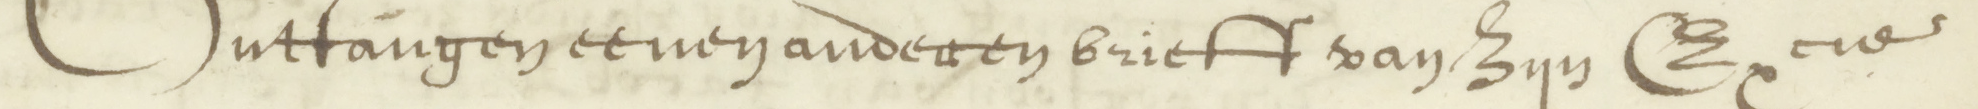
Ontfangen eenen anderen brieff van Zyn Excie
